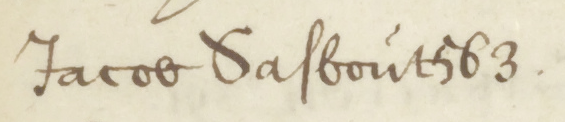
Jacob Sasbout 563.
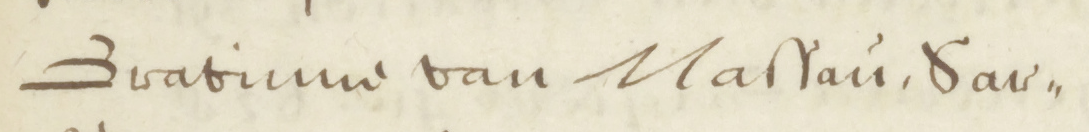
Gravinne van Nassau, Sar„
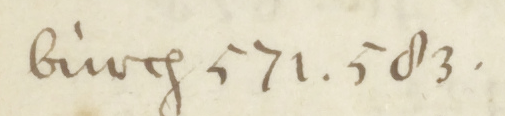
burch 571. 583.
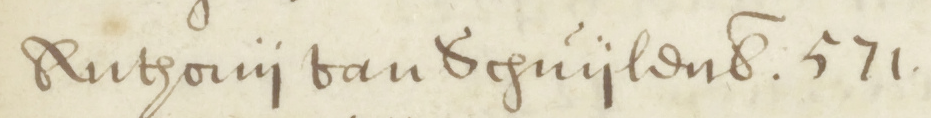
Anthonij van Schuijlenb. 571.
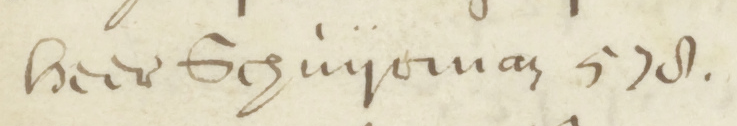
heer Schuijrman 578.
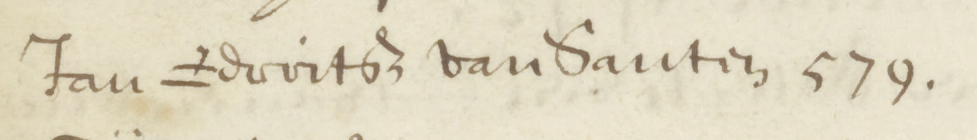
Jan Gerritsz van Santen 579.
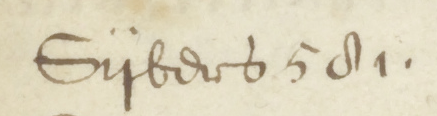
Sijbers 581.
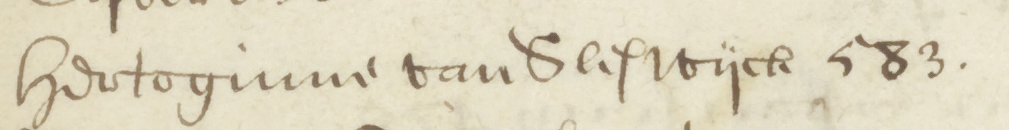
hertoginne van Sleswijck 583.
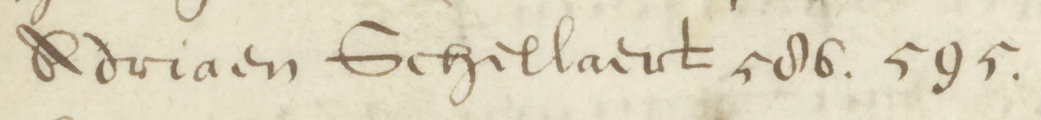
Adriaen Schellaert 586, 595.
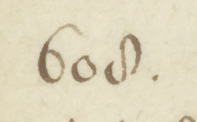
608.
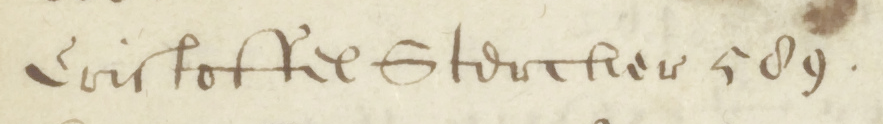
Cristoffel Stercker 589.
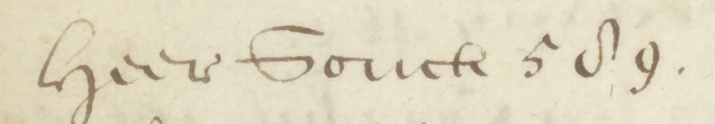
heer Sonck 589.
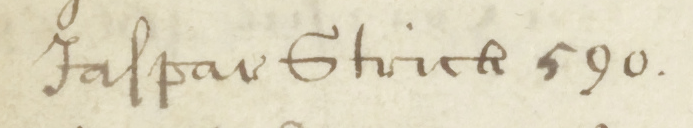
Jaspar Strick 590.
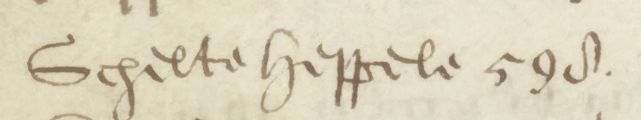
Schelte Heppele 598.
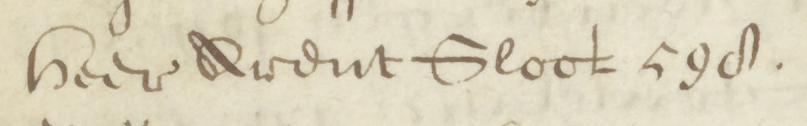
heer Arent Sloot 598.
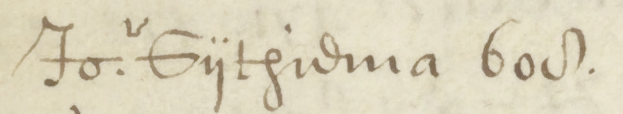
Jor: Sijthiema 608.
